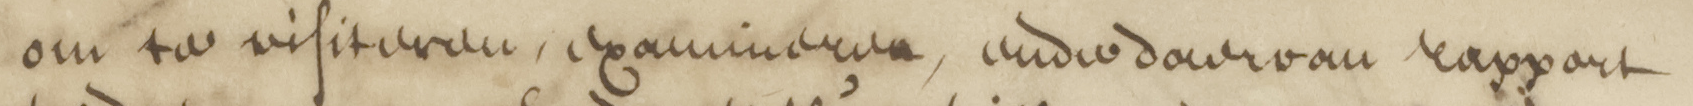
om te visiteren, examineren, ende daervan rapport
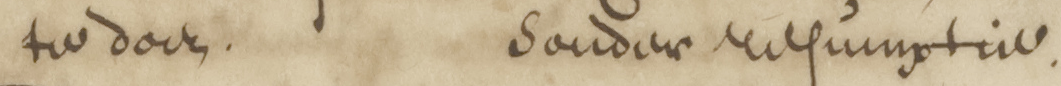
te doen. sonder resumptie.
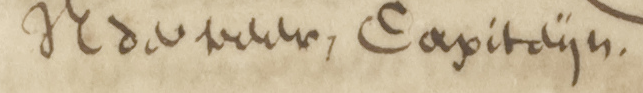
N de veer, Capiteijn.
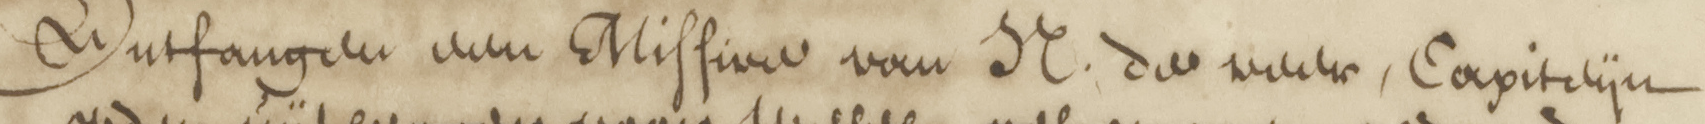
Ontfangen een Missive van N. de veer, Capiteijn
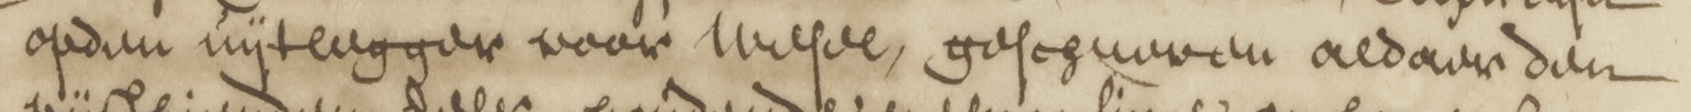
opden uijtlegger voor Wesel, geschreven aldaer den
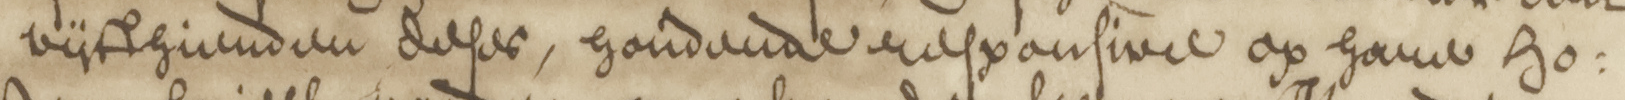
vijfthienden deses, houdende responsive op hare Ho:
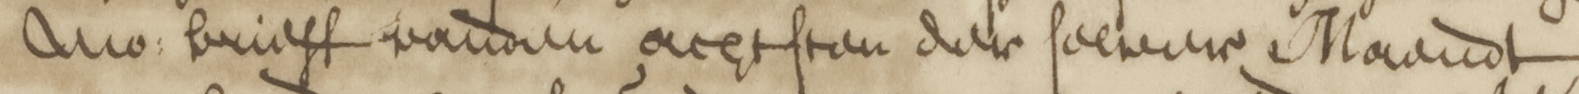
Mo: brieff vanden achtsten der selver Maendt
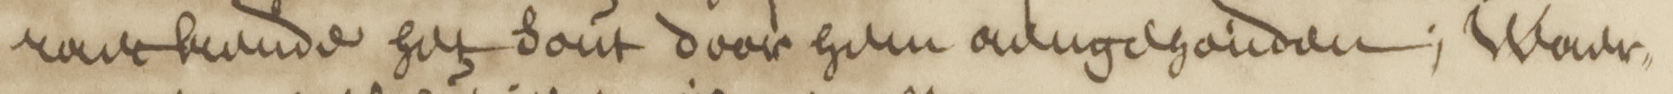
raeckende het sout door hem aengehouden; Waer„
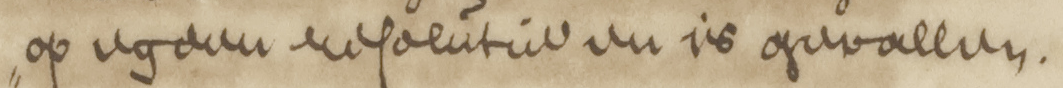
„op egeen resolutie en is gevallen.
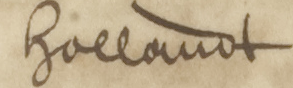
hollandt
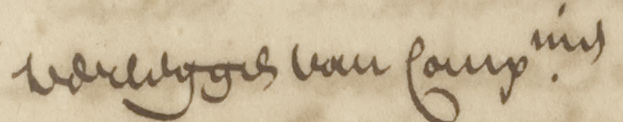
verleggen van Compnien.
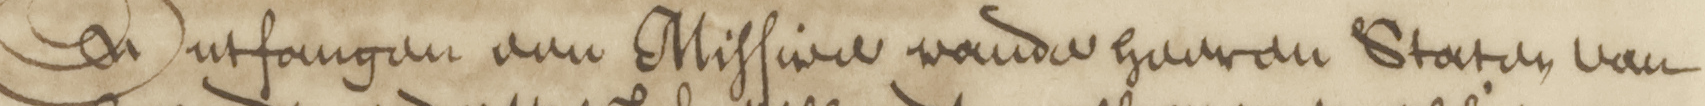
Ontfangen een Missive vande heeren Staten van
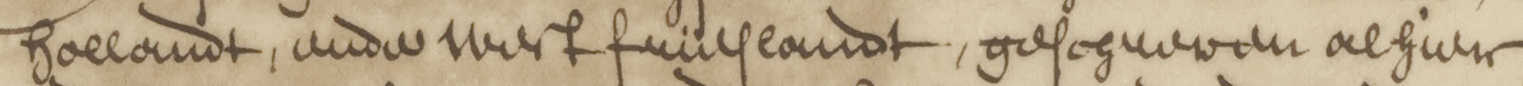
hollandt, ende Westfrieslandt, geschreven alhier
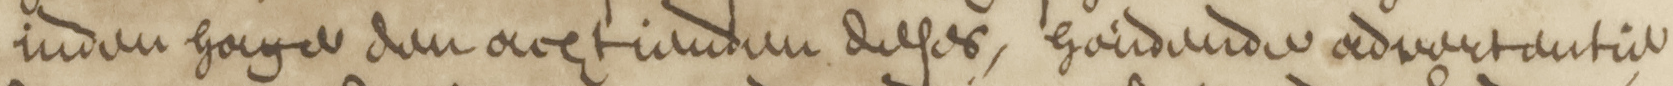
inden hage den achtienden deses, houdende advertentie
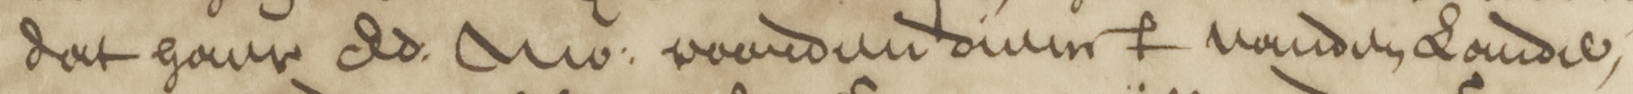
dat haer Ed:Mo: voorden dienst vanden Lande,
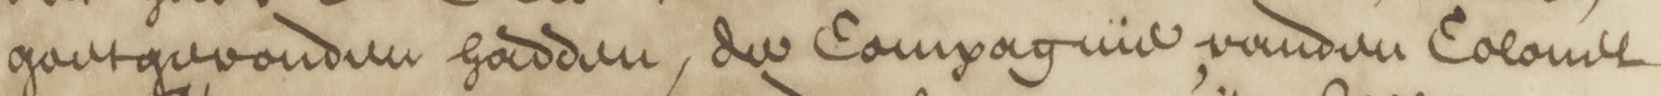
goetgevonden hadden, de Compagnie vanden Colonel
